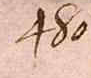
480
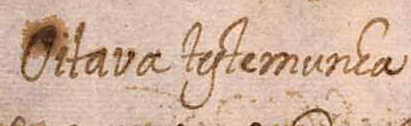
Oitava testemunha
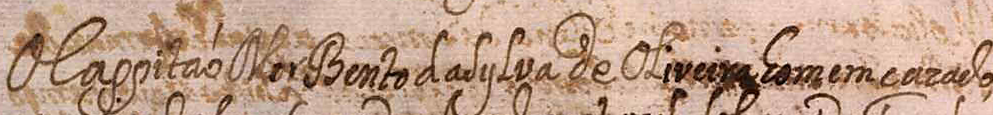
O Cappitaõ Mor Bento da Sylva de Oliveira homem cazado,
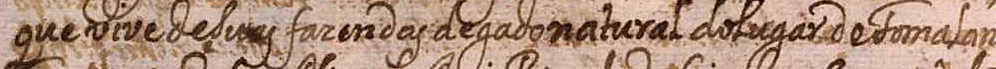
que vive de suas fazendas de gado natural do Lugar de Tomalan
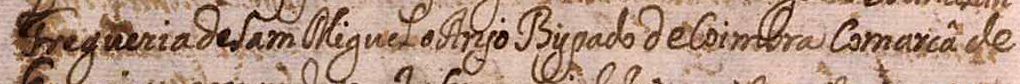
Freguezia de Sam Miguel o Anjo Bispado de Coimbra Comarca de
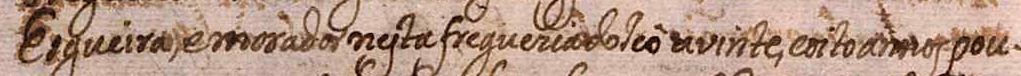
Esgueira, e morador nesta freguezia do Icô a vinte, e oito annos pou
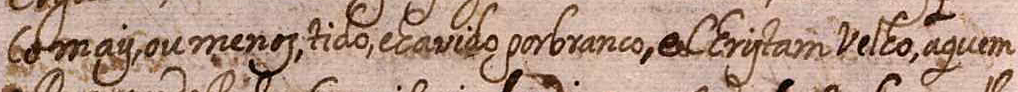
co mais, ou menos, tido, e havido por branco, e Christam velho, a quem
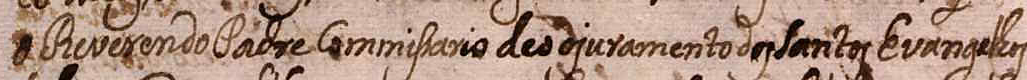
o Reverendo Padre Commissario deo o juramento dos Santos Evangelhos
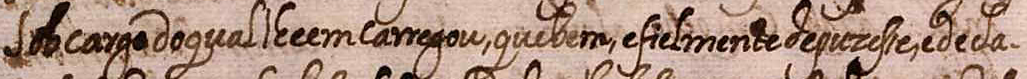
Sob cargo do qual lhe emcarregou, que bem, e fielmente depuzesse, e decla
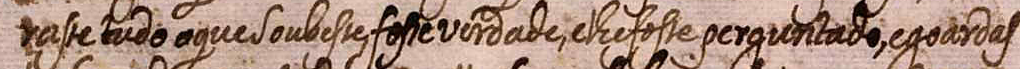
rasse tudo o que Soubesse, fosse verdade, e lhe fosse perguntado, e goardas
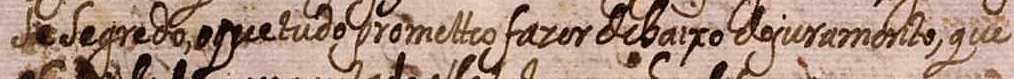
se Segredo, o que tudo prometteo fazer debaixo do juramento, que
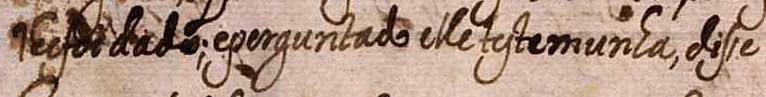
lhe foi dado; e perguntado elle testemunha, disse
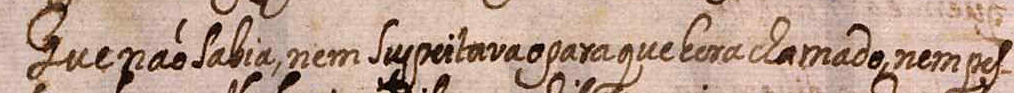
Que naõ Sabia, nem Suspeitava o para que hera chamado, nem pes
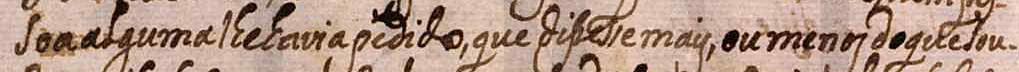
soa alguma lhe havia pedido, que dissesse mais, ou menos do que sou
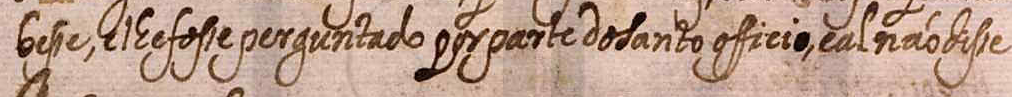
besse, e lhe fosse perguntado por parte do santo officio, e al naõ disse
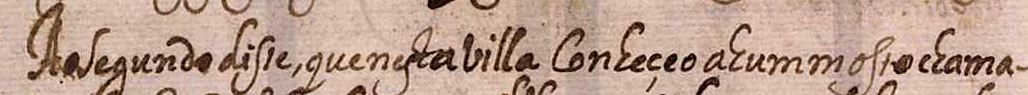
Ao Segundo disse, que nesta villa Conheceo a hum mosso chama
